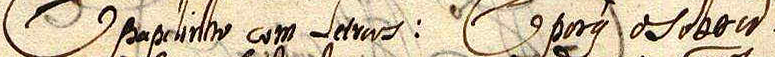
E papelinho com Letras: E porq̄ o sobred.o
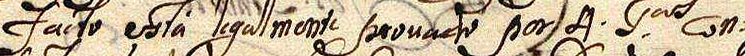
facto está legalmente prouado por 4. T.as con
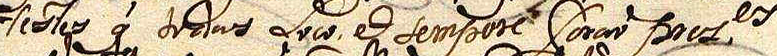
testes q̄ todas loco, et tempore foraõ prez.es
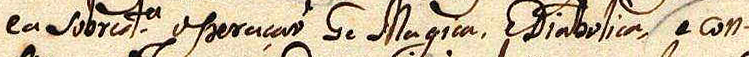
e a sobred̄.a operaçaõ he Magia, e Diabolica, e con
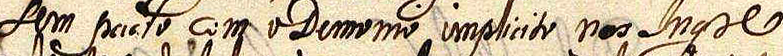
tem pacto com o Demonio implicito nos Ingre
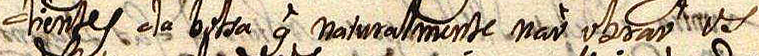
dientes da bolsa q̄ naturalmente naõ obraõ os
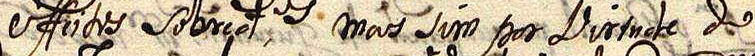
effeitos sobred̄os, mas sim por Virtude do
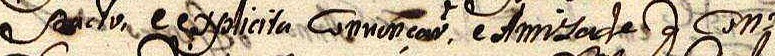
pacto, e explicita Conuençaõ, e Amizade q̄ Con
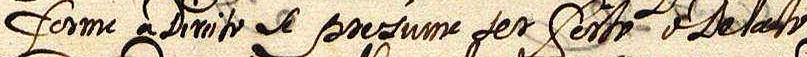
forme a Direito se prezume ter feito o Delato
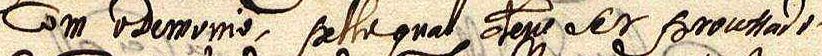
Com o Demonio, pello qual deue ser processado
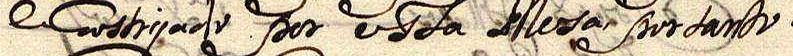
e Castigado por esta Mesa, portanto.
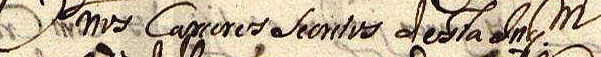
nos Carceres Secretos desta Inq.m
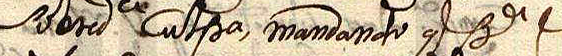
sobreda Culpa, mandando q̄ pa
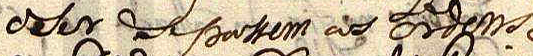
o ser se passem as ordens
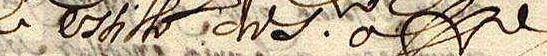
E estillo do S.to offo
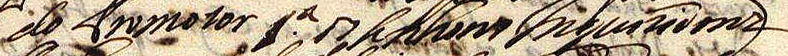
do Promotor p.a os senhores Inquizidorez
